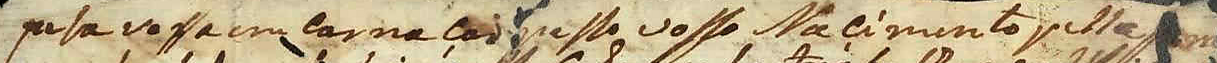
pela vossa emcarnaçaõ pello vosso Naçimento pella
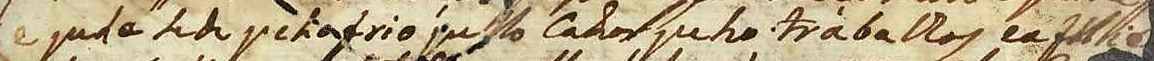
E pela sede pela frio pello Calor pelo trabalhos e a follio
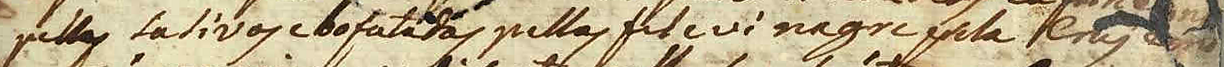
pellas salivas e bofatadas pellos fel e vinagre pela Crus
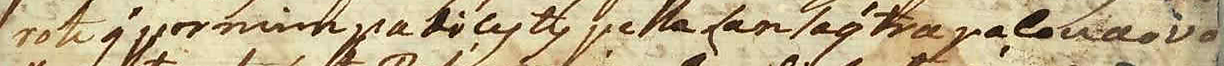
rote q̄ por mim padiçestes pella Lansa q̄ trapaçou ao vo
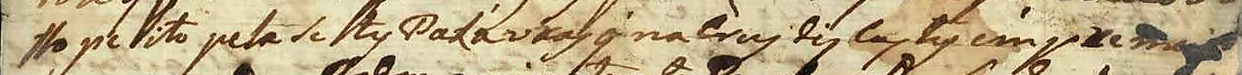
sso peito pela setes PaLavras q̄ na Crus disCestes em prem
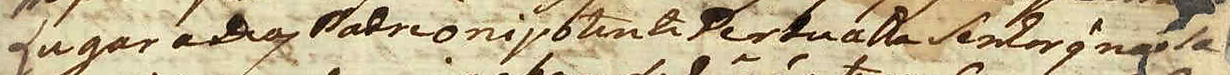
Lugar a Deos Padre onipotente Perdualho Senhor q̄ naõ sa
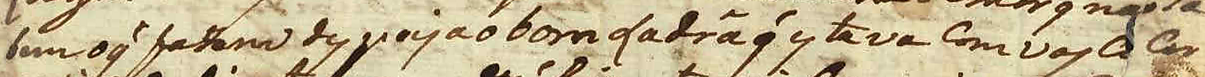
bem o q̄ fasem despois ao bom Ladrã q̄ estava com vosco cor
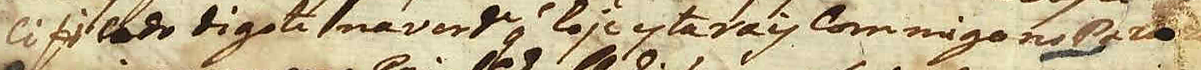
cificado digote na verd.e q̄ hoje estarais Commigo no Par
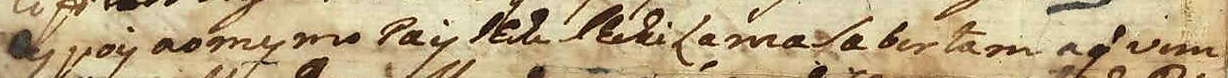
despois ao mesmo Pais lhele lhehi Lama saber tam a q̄ vem
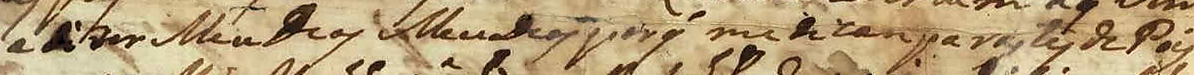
a dizer Meu Deos Meu Deos porq̄ me dezamparastes dePois
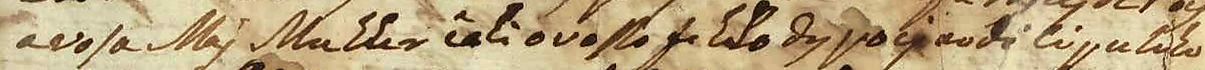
a vosa Maj Mulher ē ahi o vosso filho despois ao dicipulu Eu
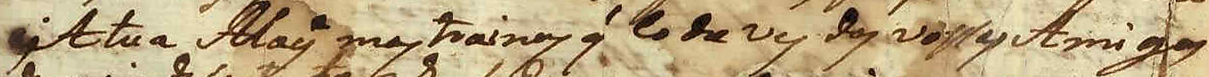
A tua May mas trainas q̄ Co da ves dos vossos Amigos
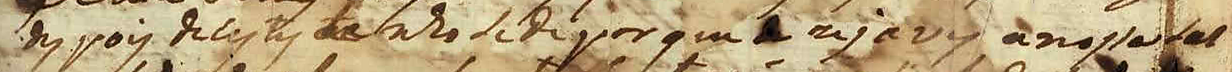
despois decestes tenho sede porque dezejaves a nossa sal
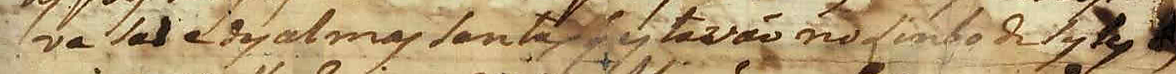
vasaõ e das almas santas q̄ estavaõ no Linbo diSestes
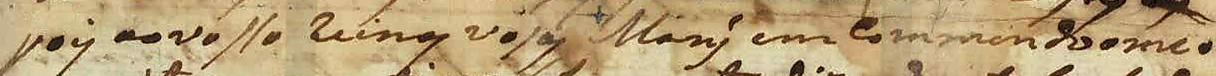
pois ao vosso Reino vosas Mans̄ emCommendo o meo
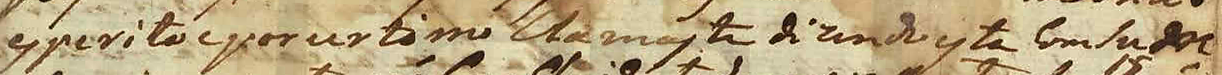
esperito e por urtimo Chamaste dizendo esta Comsuda
